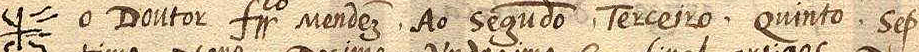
o Doutor frrco Mende̅z, Ao ee̅gudo, Terceiro, Quinto, Sep
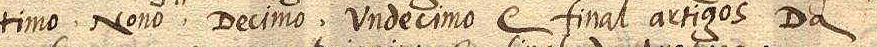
timo, Nono, Decimo, Vndecimo e final artigos Da
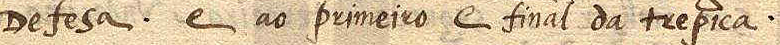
Defesa . e ao primeiro e final da trepica.
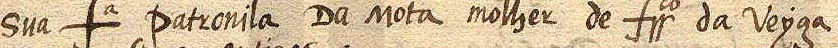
Sua fa Patronila Da Mota molher de frrco da Veyga
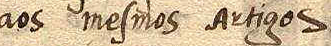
aos mesmos Artigos
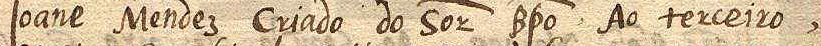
Joane Mende̅z Criado do S̅or B̅po, Ao terceiro,
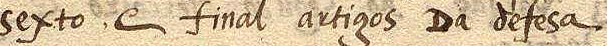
sexto, e final artigos Da defesa
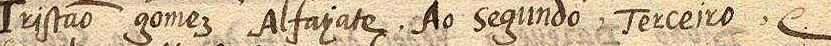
Tristão g̅omez Alfayate. Ao Segundo, Terceiro, e
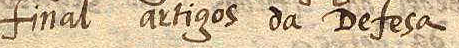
final artigos da Defesa
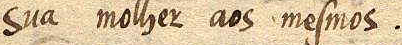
Sua molher aos mesmos.
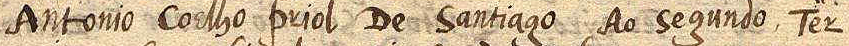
Antonio CoElho Priol De Santiago Ao Segundo, Ter
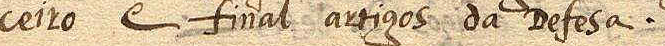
ceiro e final artigos da Defesa.
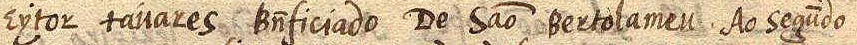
Eytor tauares Bn̅ficiado De São Bertolameu, Ao Segu̅do
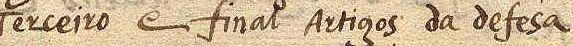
Terceiro e final Artigos da defesa
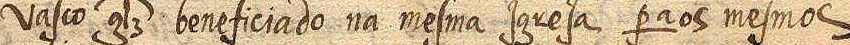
Vasco g̅lz beneficiado na mesma JgreJa ꝑa os mesmos
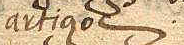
artigos.
